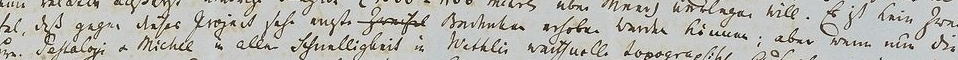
fel, daß gegen dieses Project sehr ernste Zweifel Bedenken erhoben werden können; aber wenn nun die
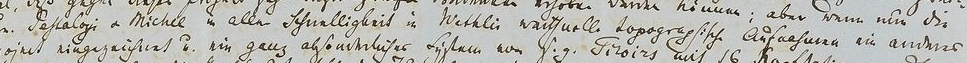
Hrn. Pestalozzi & Michel in aller Schnelligkeit in Wethlis werthvolle topographische Aufnahmen ein anderes
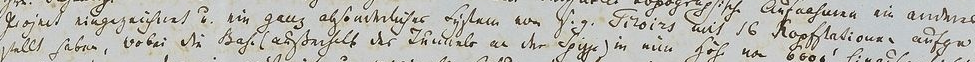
Project eingezeichnet u. ein ganz absonderliches System von s.g. Tiroirs mit 16 Kopfstationen aufge-
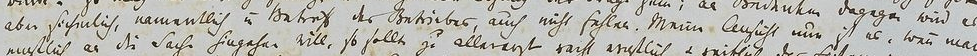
aber sicherlich, namentlich in Betreff des Betriebes, auch nicht fehlen. Meine Ansicht nun ist es, wenn man
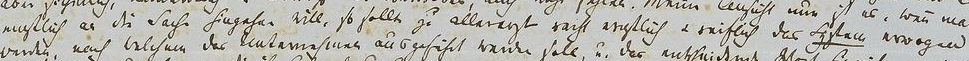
ernstlich an die Sache hingehen will, so sollte zu allererst recht ernstlich & reiflich das System erwogen
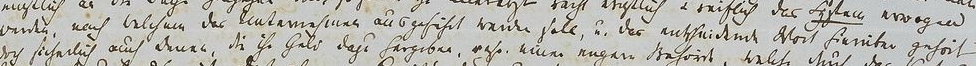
werden, nach welchem das Unternehmen ausgeführt werden soll, u. das entscheidende Wort hierüber gehört
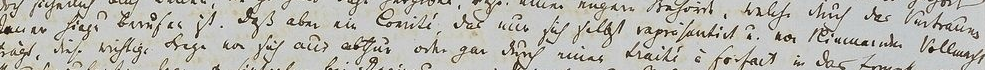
Jener hiezu berufen ist. Daß aber ein Comité, das nur sich selbst repräsentiert u. von Niemanden Vollmacht
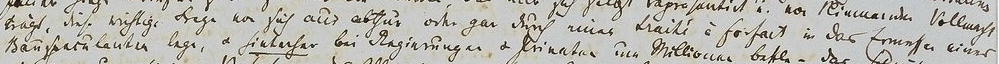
trägt, diese wichtige Frage von sich aus abthue oder gar durch einen traité à forfait in das Ermessen eines
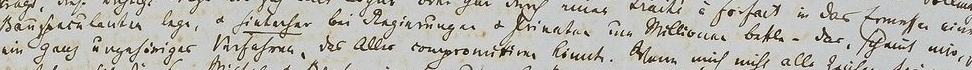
Bauspeculanten lege, & hinterher bei Regierungen & Privaten um Millionen bettle – das, scheint mir,
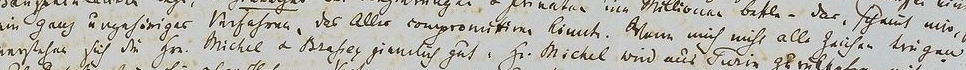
ein ganz ungehöriges Verfahren, das Alles compromittiren könnte. Wenn mich nicht alle Zeichen trügen,
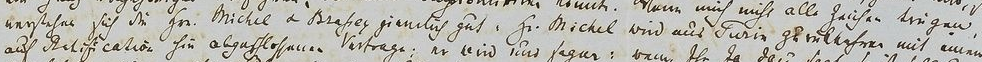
verstehen sich die Hrn. Michel & Brassey ziemlich gut. Hr. Michel wird aus Turin zurückkehren mit einem
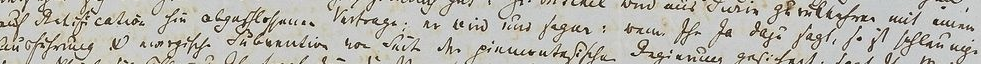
auf Ratification hin abgeschlossenen Vertrage; er wird uns sagen: wenn Ihr Ja dazu sagt, so ist schleunige
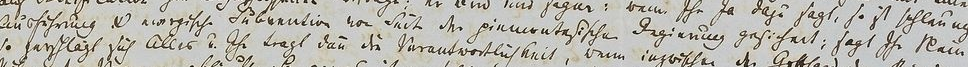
Ausführung & energische Subvention von Seite der piemontischen Regierung gesichert; sagt Ihr Nein,
